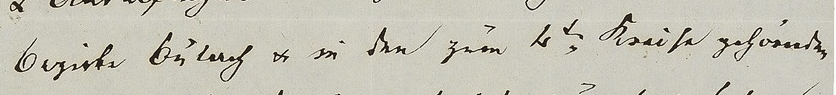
Bezirke Bülach & in den zum 4ten Kreise gehörenden
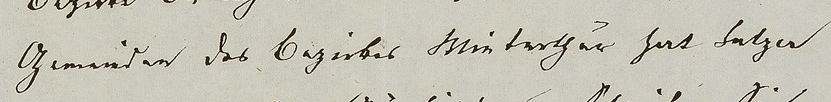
Gemeinden des Bezirkes Winterthur hat Sulzer
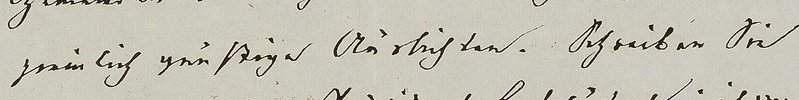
ziemlich günstige Aussichten. Schreiben Sie
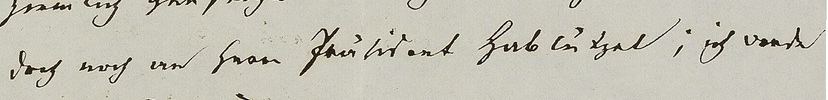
doch noch an Herrn Präsident Hablützel; ich werde
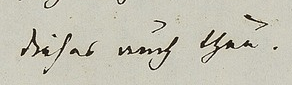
dieses auch thun.
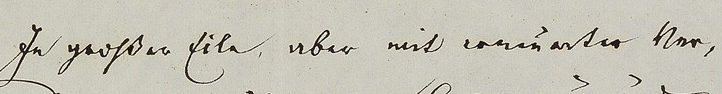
In großer Eile, aber mit erneuerter Ver-
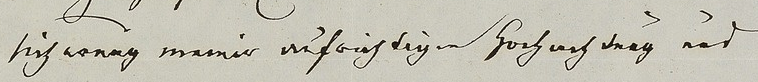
sicherung meiner aufrichtigen Hochachtung und
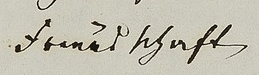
Freundschaft
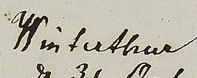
Winterthur
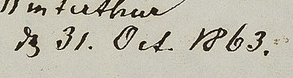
den 31. Oct. 1863.
